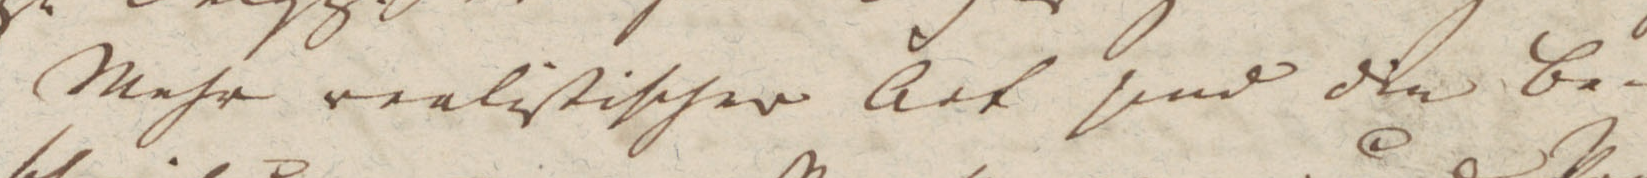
Mehr realistischer Art sind die Be-
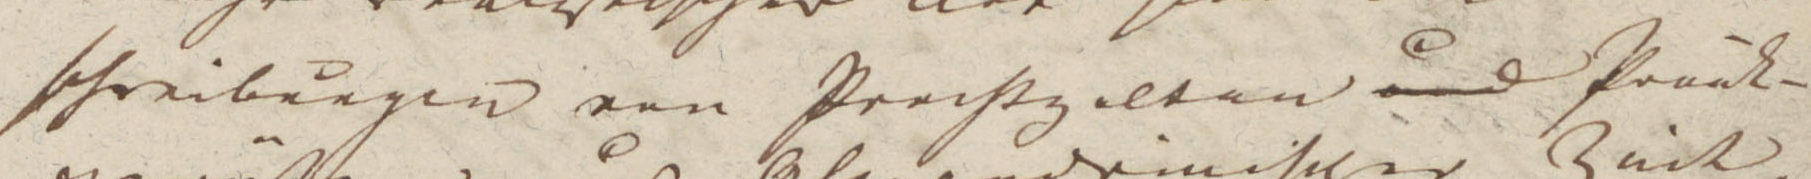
schreibungen von Prachtzelten und Prunk-
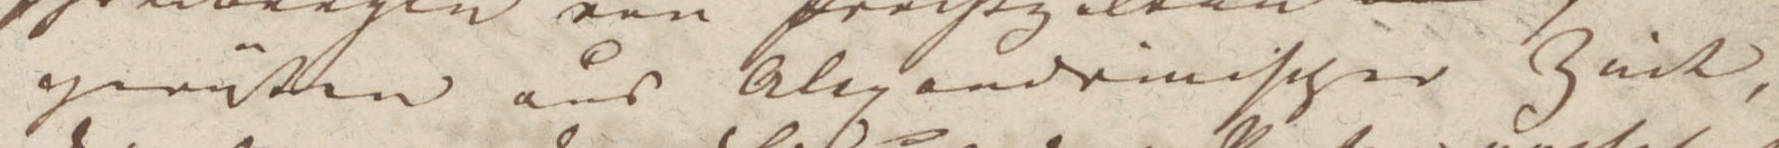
geräten aus Alexandrinischer Zeit,
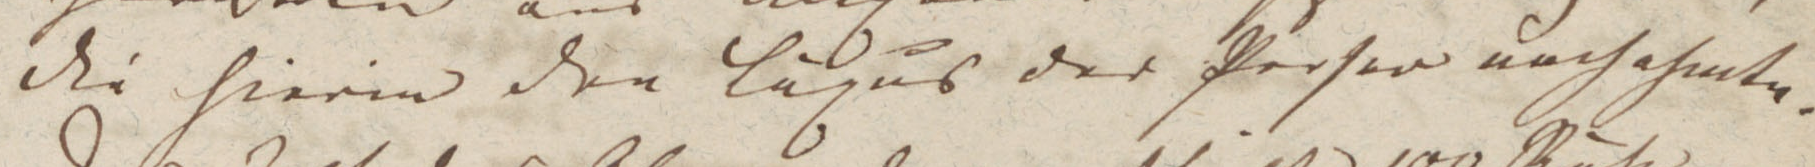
die hierin den Luxus der Perser nachahmte.
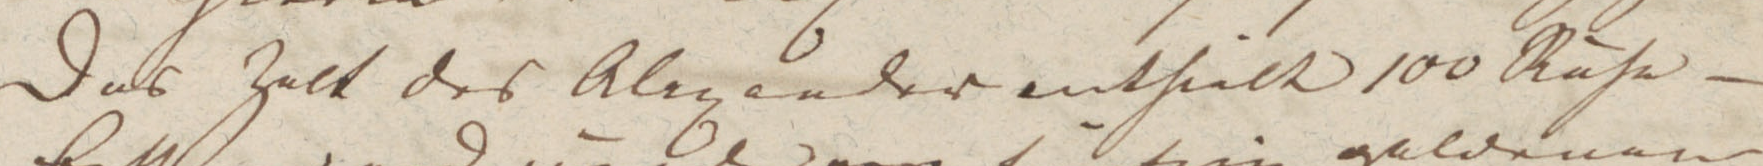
Das Zelt des Alexander enthielt 100 Ruhe-
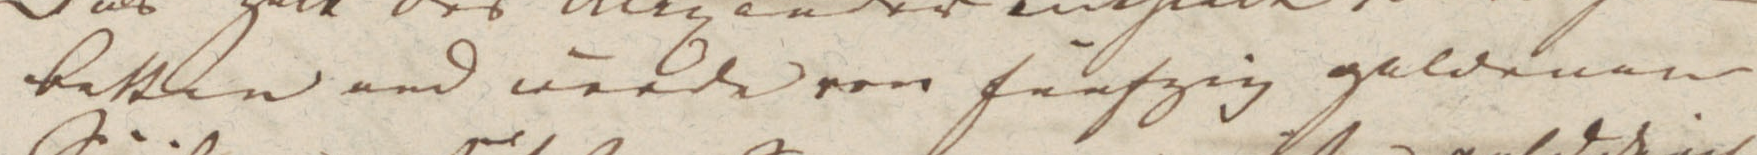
betten und wurde von fünfzig goldenen
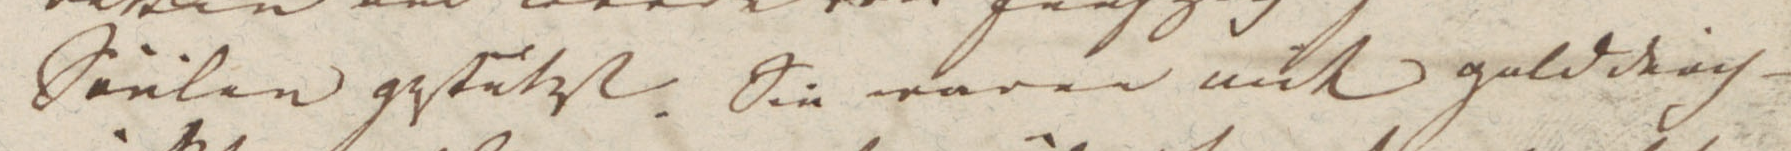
Säulen gestützt. Sie waren mit golddurch-
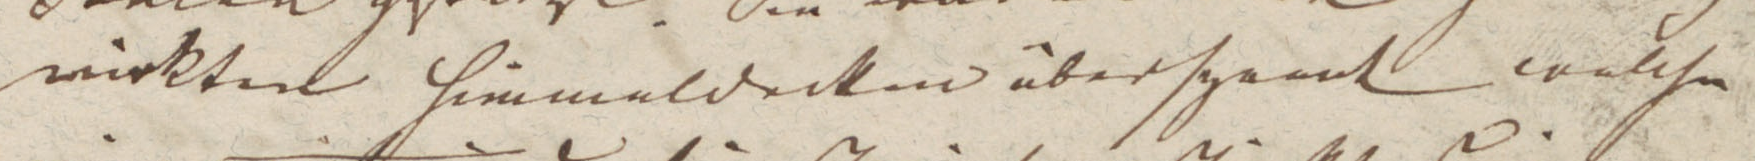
wirkten Himmeldecken überspannt welche
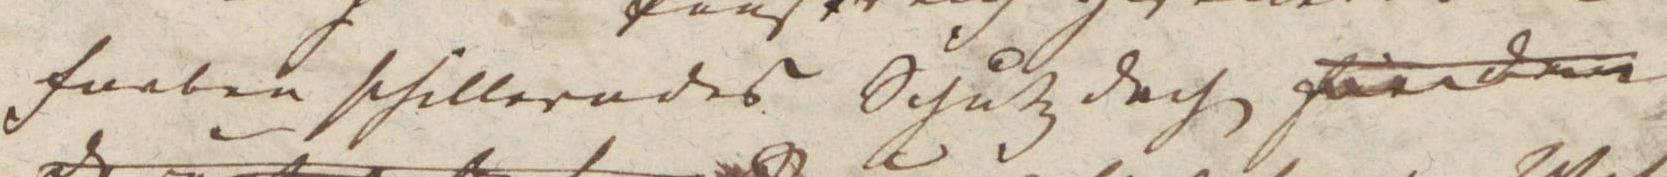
Farben schillerndes Schutzdach, für den
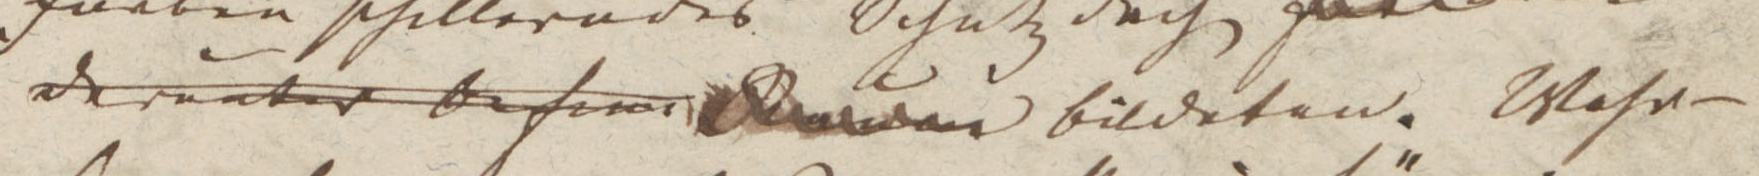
darunter befin Raum bildeten. Wahr-
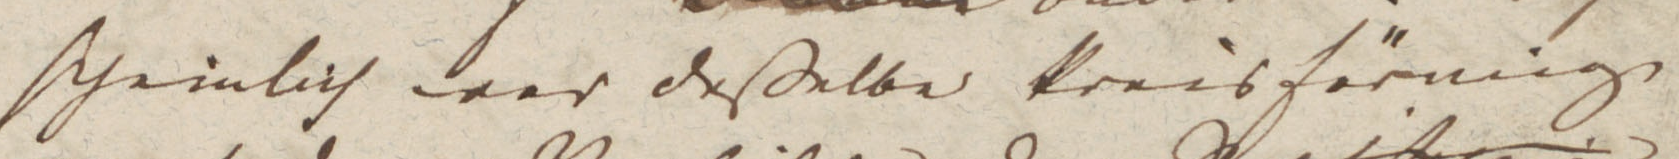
scheinlich war dasselbe kreisförmig
